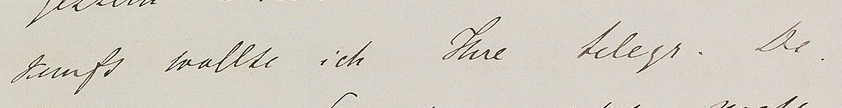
kunft wollte ich Ihre telegr. De-
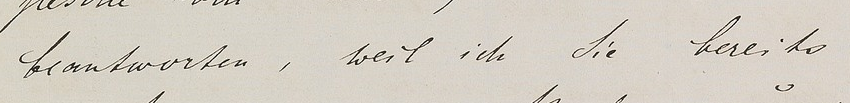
beantworten, weil ich Sie bereits
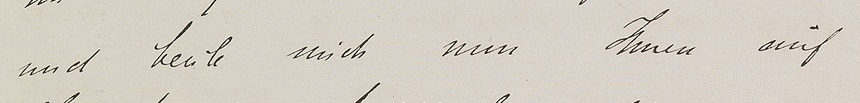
und beeile mich nun Ihnen auf
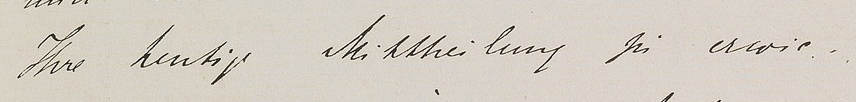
Ihre heutige Mittheilung zu erwie-
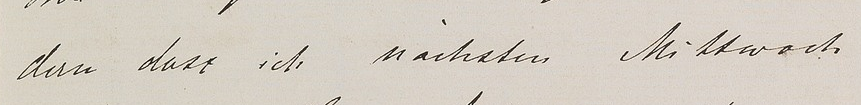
dern dass ich nächsten Mittwoch
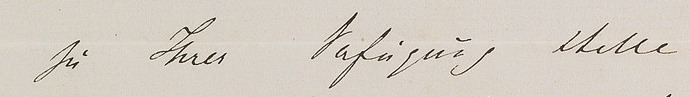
zu Ihrer Verfügung stelle
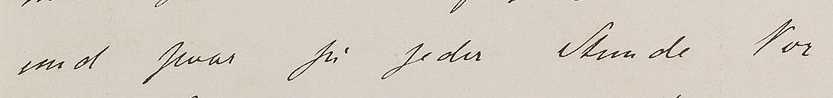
und zwar zu jeder Stunde Vor-
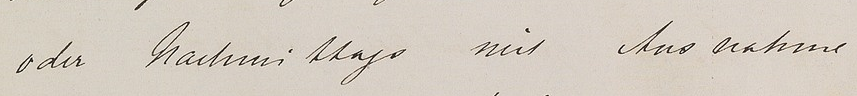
oder Nachmittags mit Ausnahme
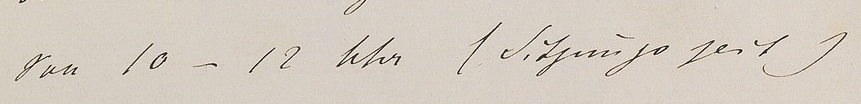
von 10–12 Uhr (Sitzungszeit).
